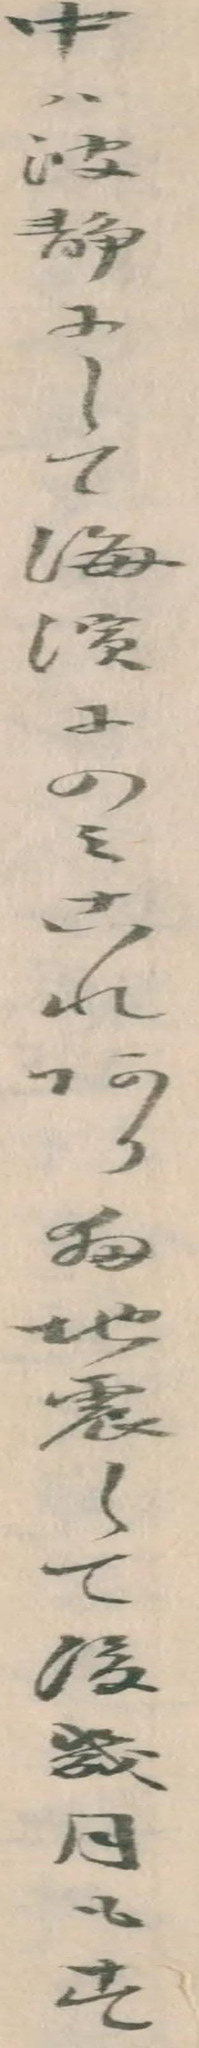中は波静にして海浜にのみこれあり扨地震して後幾月もす
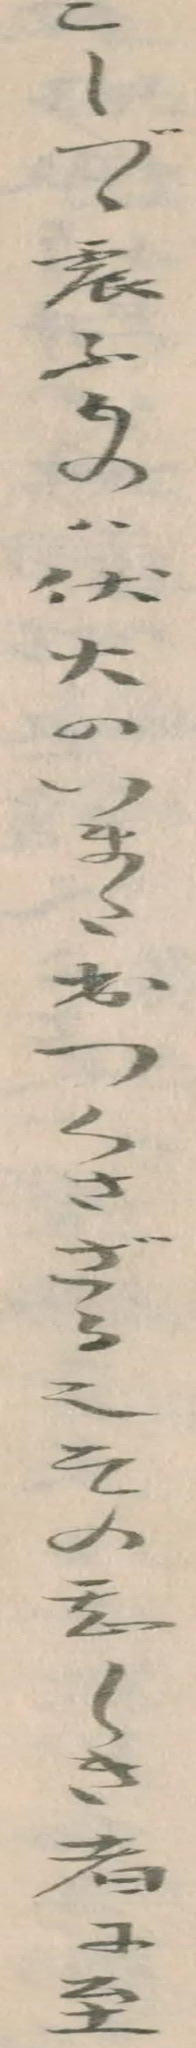こしづゝ震ふものは伏火のいまた出つくさざる也その甚しき者に至
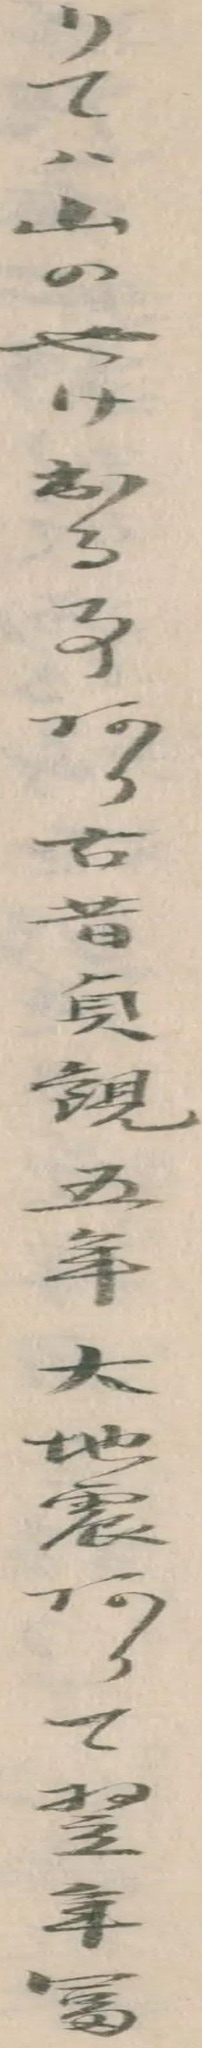りては山のやけ出る事あり古昔貞観五年大地震ありて翌年冨
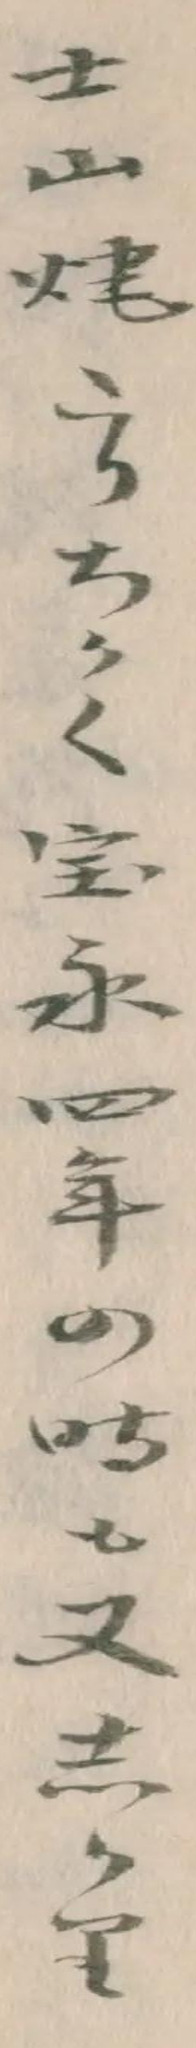士山焼たりちかく宝永四年の時も又しかり
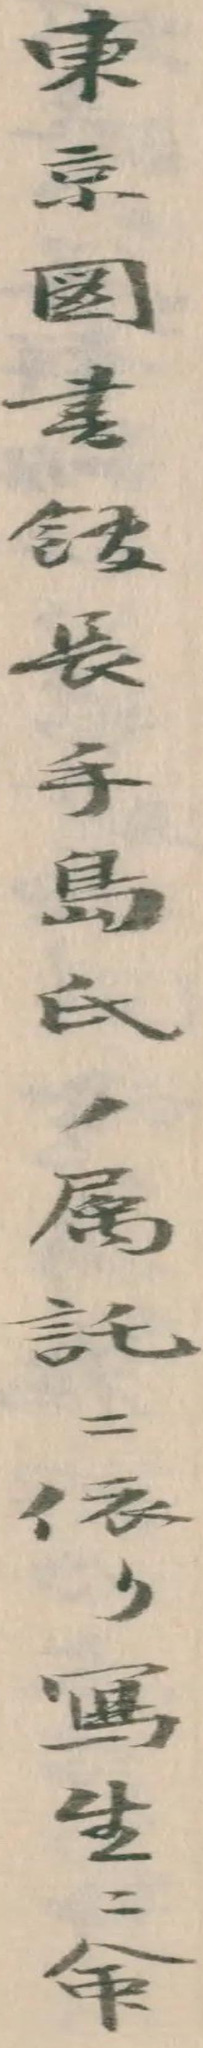東京図書館長手島氏ノ属託ニ依リ写生ニ命
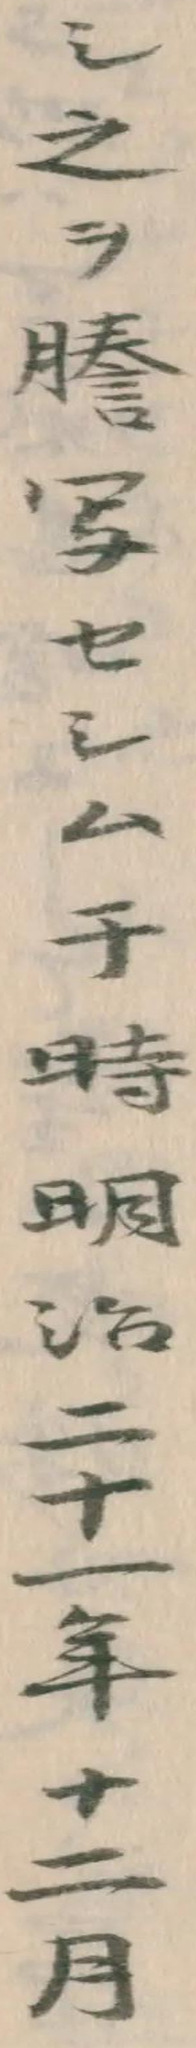シ之ヲ謄写セシム于時明治二十一年十二月
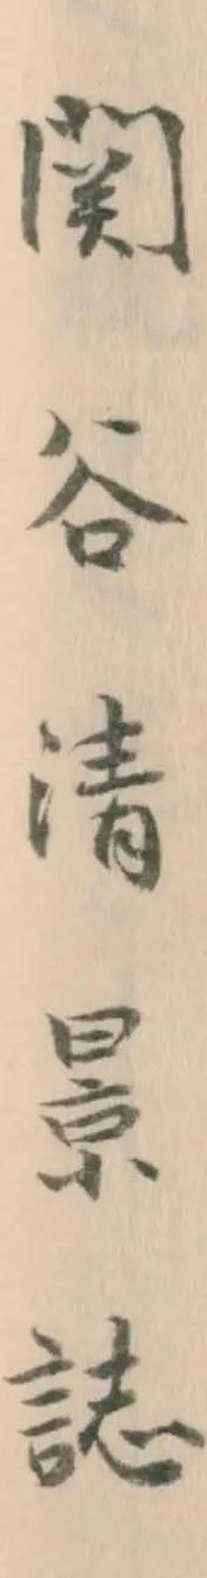関谷清景誌

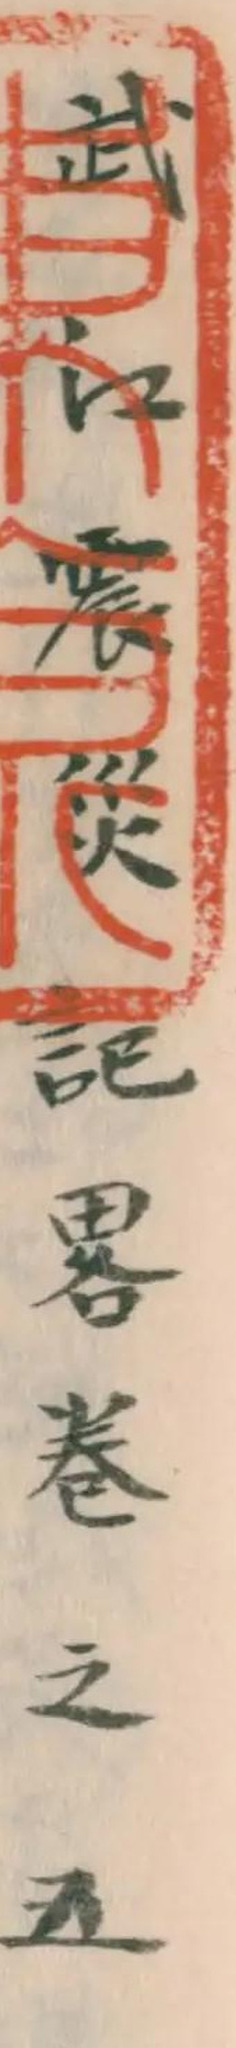武江震災記略巻之五
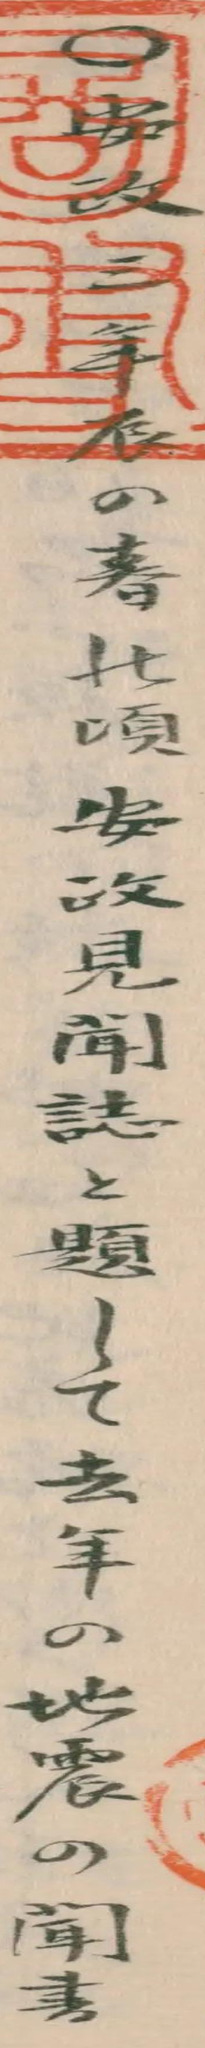〇安政三年辰の春の頃安政見聞誌と題して去年の地震の聞書
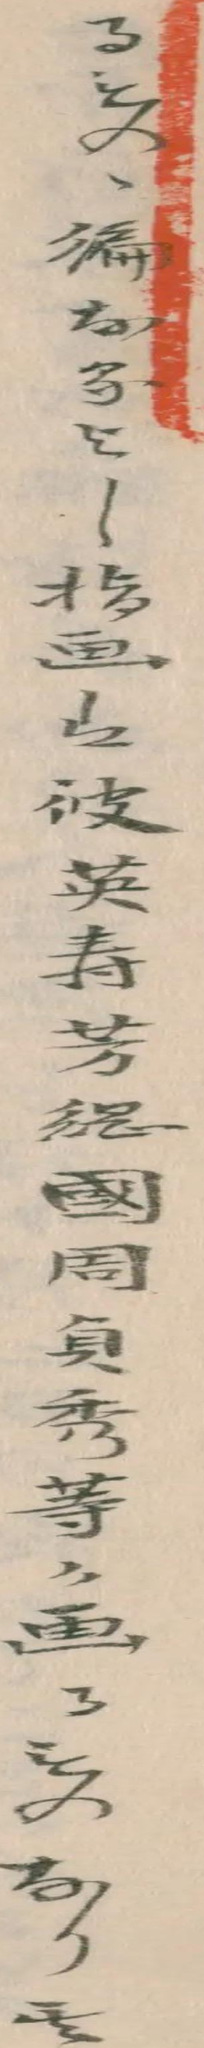るものゝ編なるよし指画は彼英寿芳綱国周貞秀等か画るものなり其
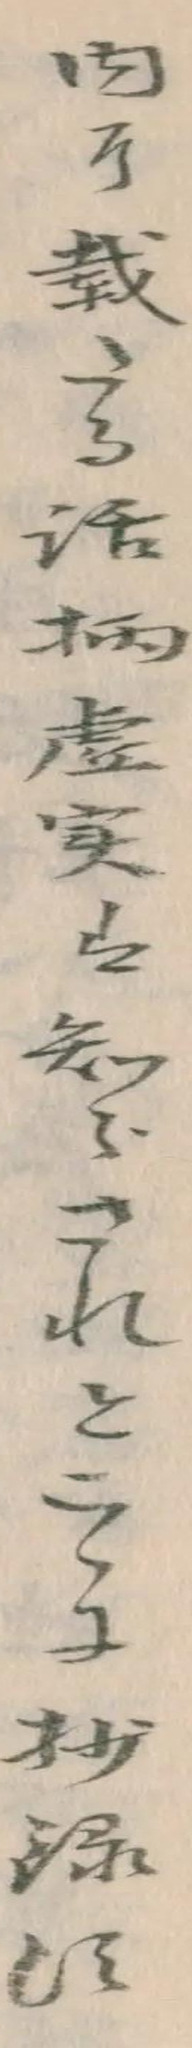内に載たる話柄虚実は知らされとこゝに抄録す
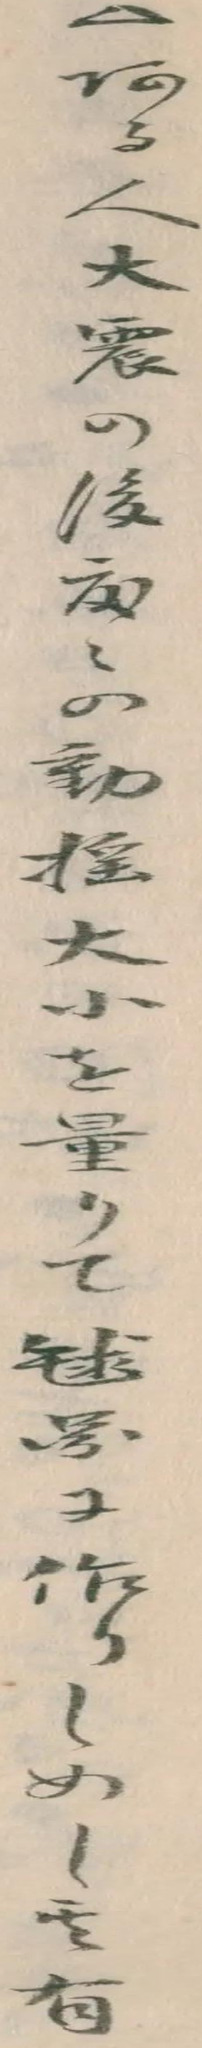△ある人大震の後度々の動揺大小を量りて毬円に作りしめし其有
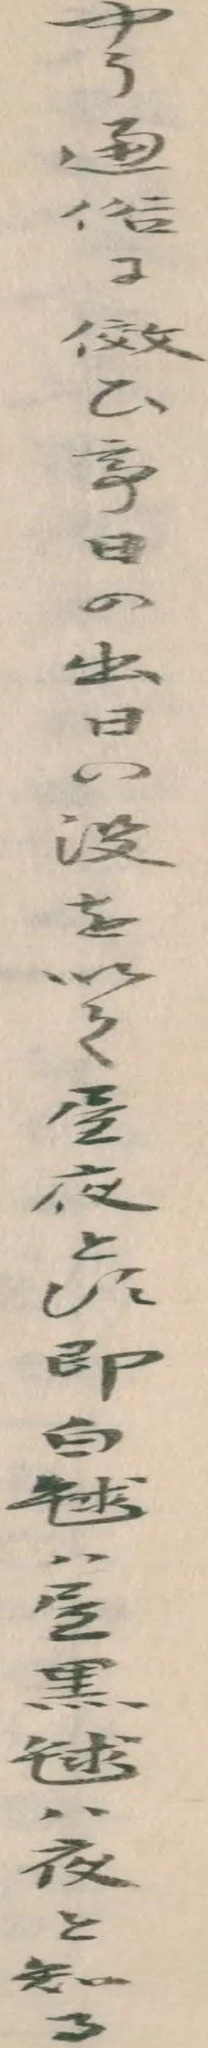やう通俗に倣ひて日の出日の没を以て昼夜とす即白毬は昼黒毬は夜と知る
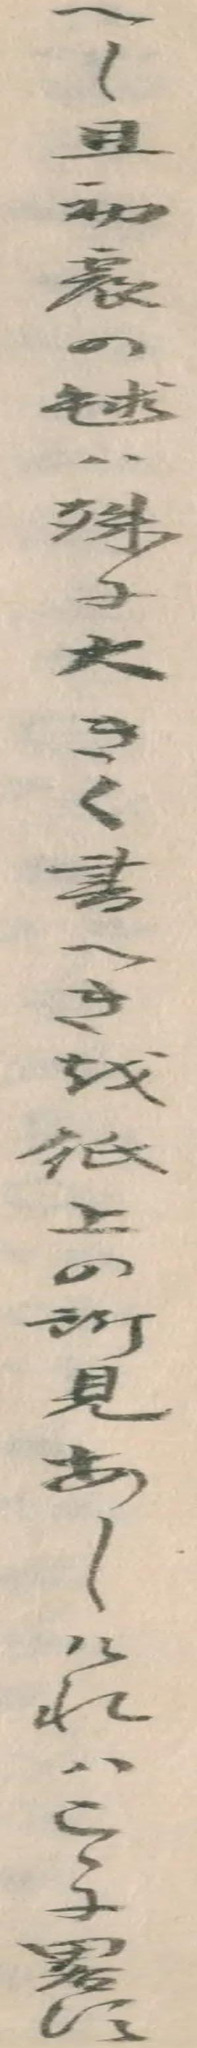へし勝且初震の毬は殊に大きく書へきを紙上の所見あしけれはこゝに略す

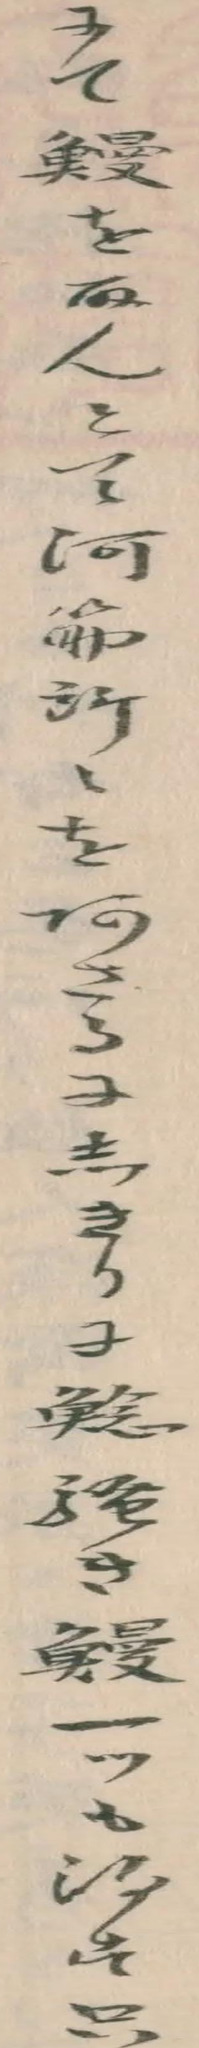にて鰻を取んとて河筋所々をあさるにしきりに鯰騒き鰻一ツも得す只
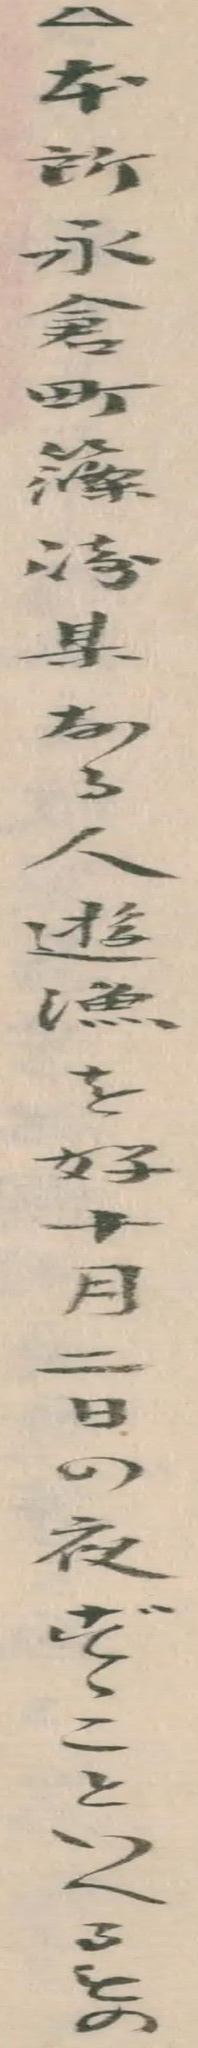△本所永倉町篠崎某なる人遊漁を好十月二日の夜ずゝこといへるもの
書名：地災撮要. 巻10(地震之部) 上,下
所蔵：国立国会図書館 National Diet Library, JAPAN
